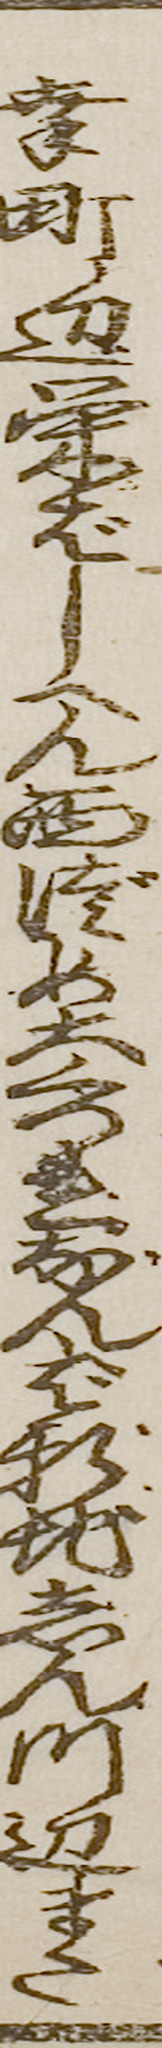幸町の辺栄ばしへん西づめ大くづれなんば新地しん川辺また
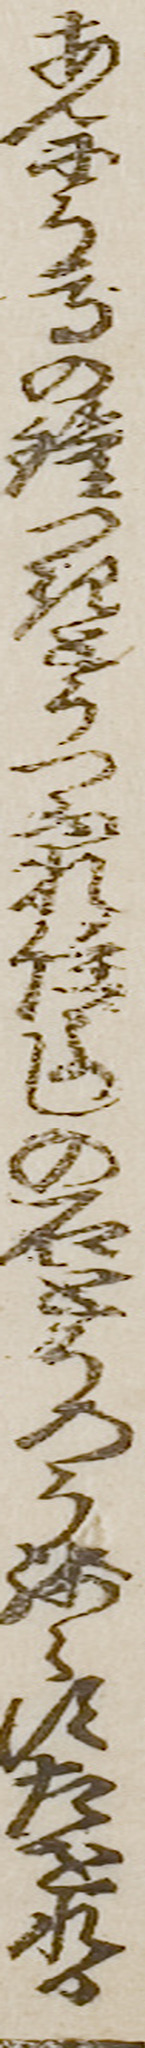あんにう寺の鐘つきとうつふれ住よしの石とうろう残らすたをれる
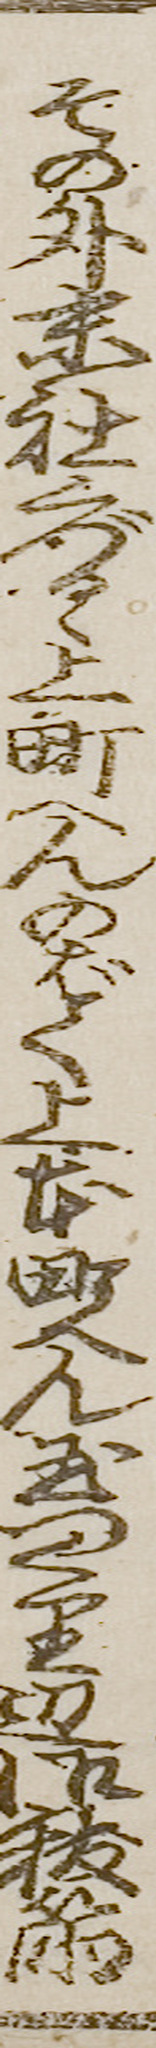その外末社くづるゝ上町へんのばて上本町へん玉つくり辺御祓筋
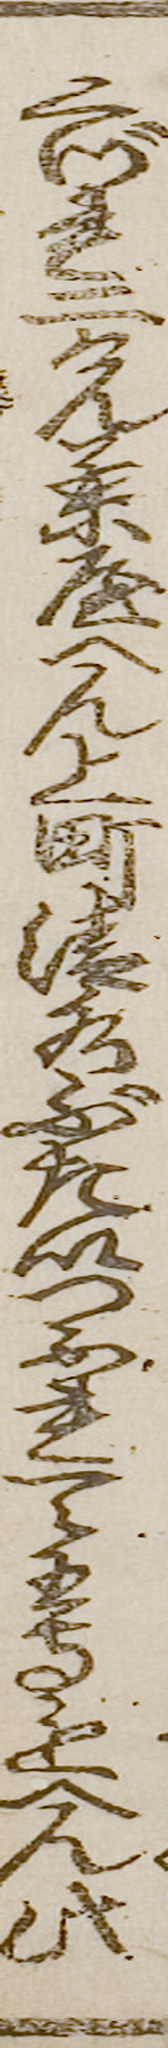くずれ二けん茶屋へん上町清水ぶたいつふれ天王寺近へん此
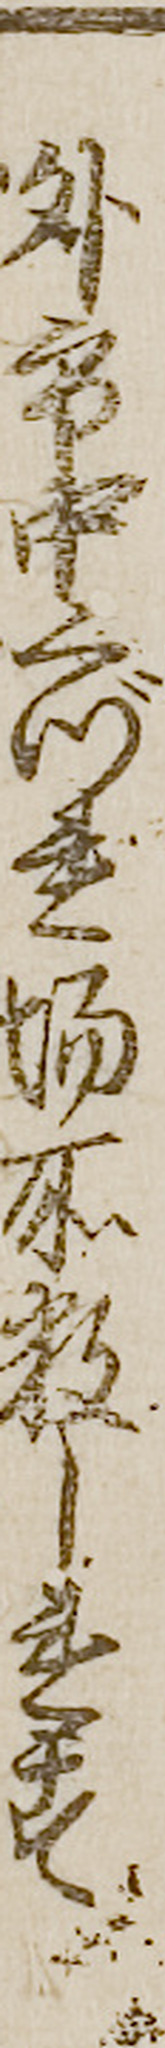外市中くづれ場所数しれす
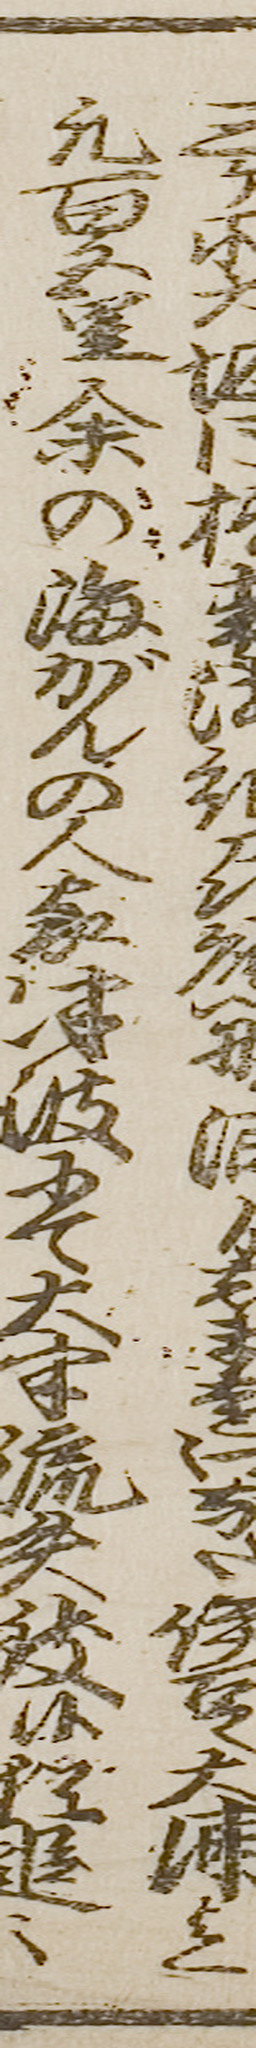凡百五里余の海がんの人家津波にて大半流出致候猶追々
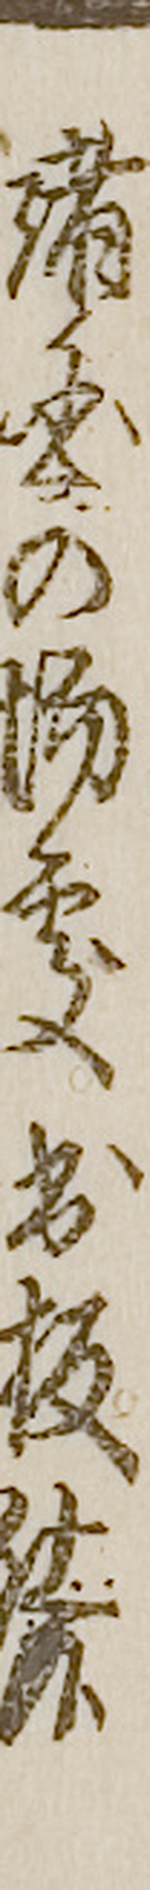諸国の場処出板仕候
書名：大坂大地震津浪記
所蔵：東京大学総合図書館 General Library in the University of Tokyo, JAPAN
